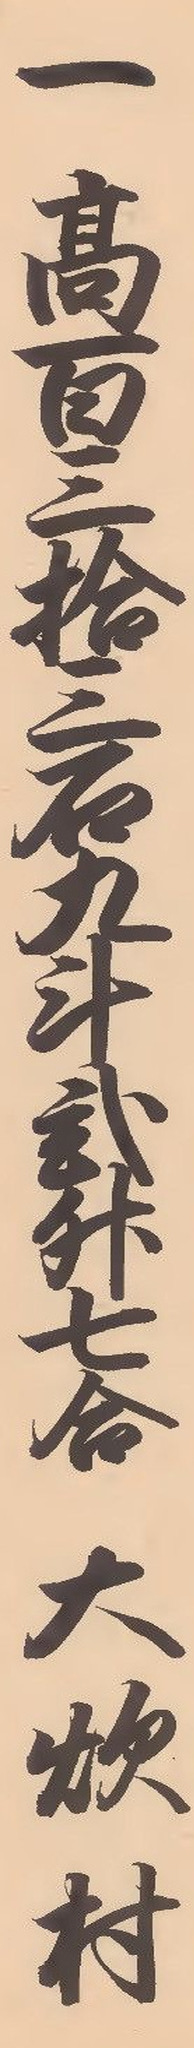一高百三拾三石九斗弐升七合大炊村

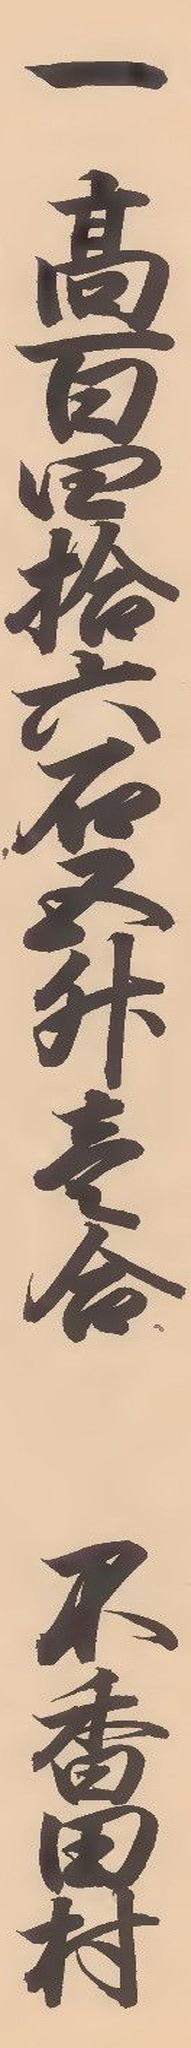一高百四拾六石五升壱合不香田村
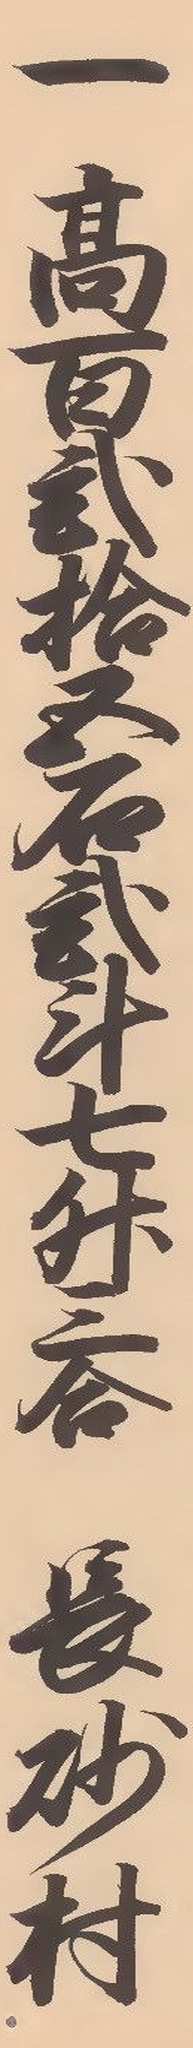一高百弐拾五石弐斗七升三合長砂村
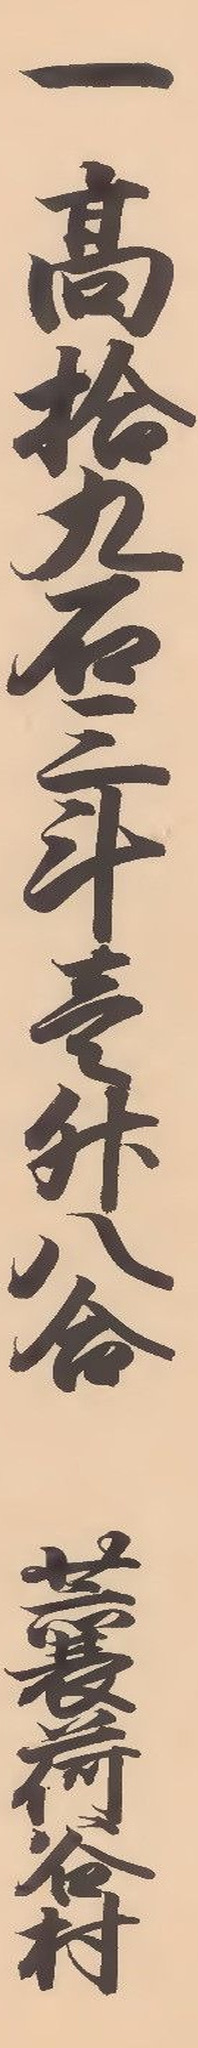一高拾九石三斗壱升八合蘘荷谷村
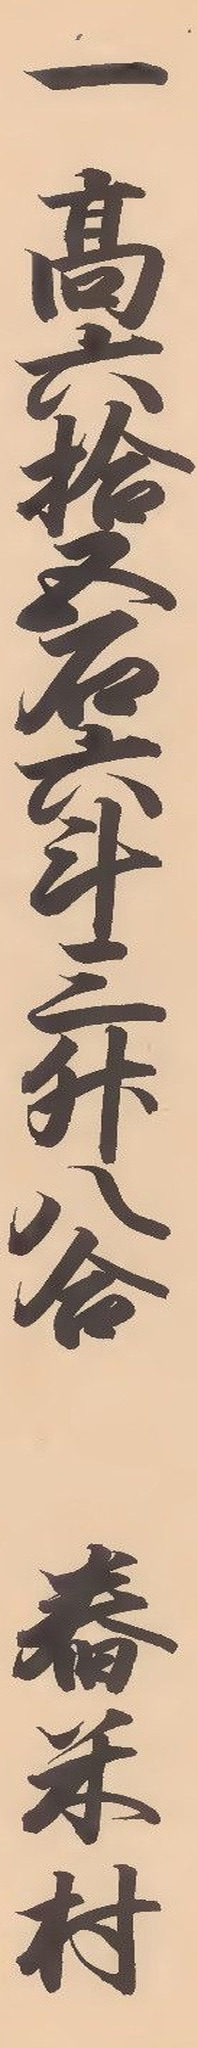一高六拾五石六斗三升八合舂米村
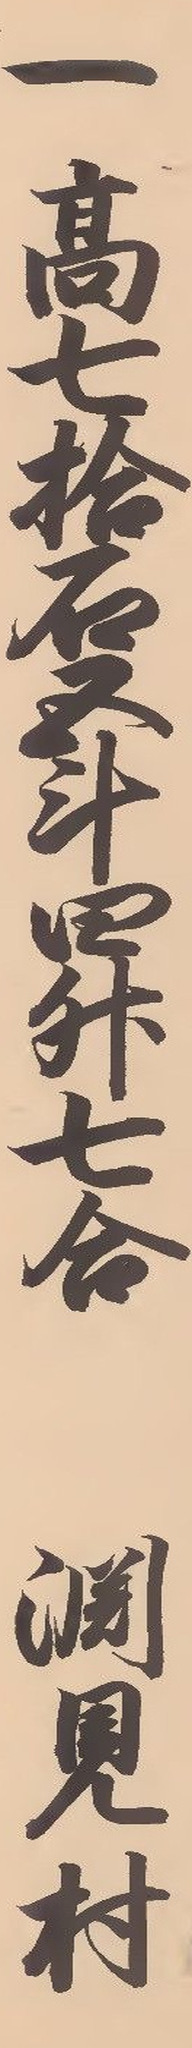一高七拾石五斗四升七合渕見村
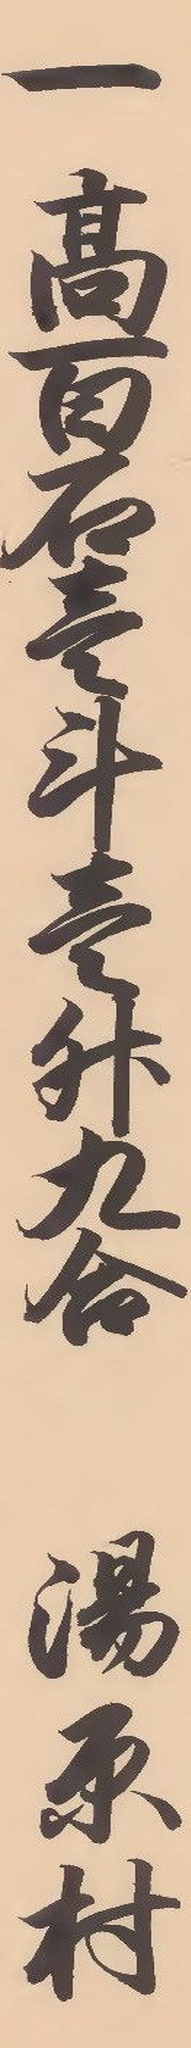一高百石壱斗壱升九合湯原村
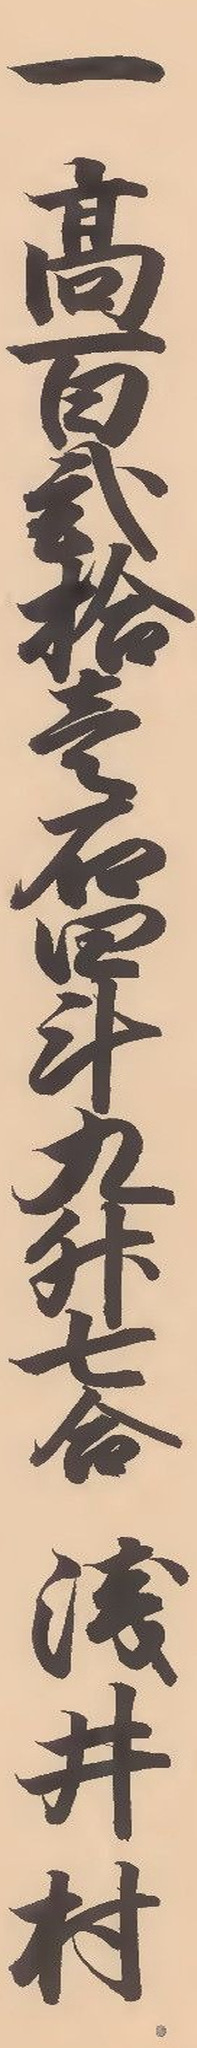一高百弐拾壱石四斗九升七合浅井村
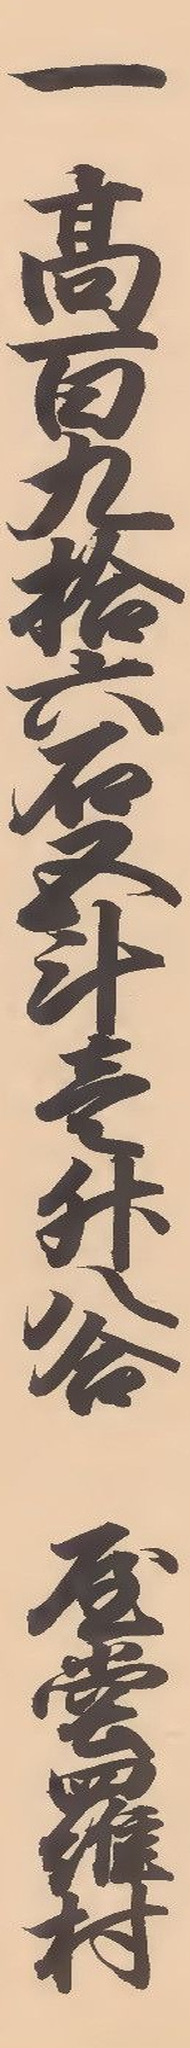一高百九拾六石五斗壱升八合屋堂羅村

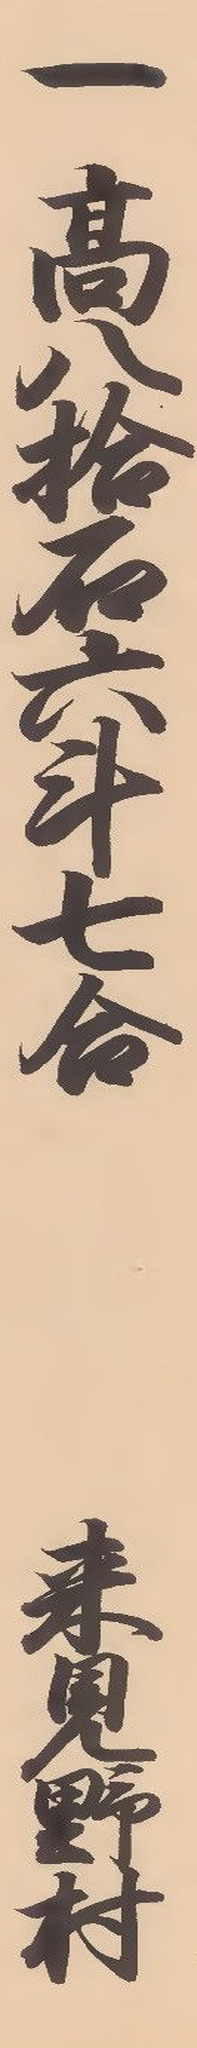一高八拾石六斗七合来見野村
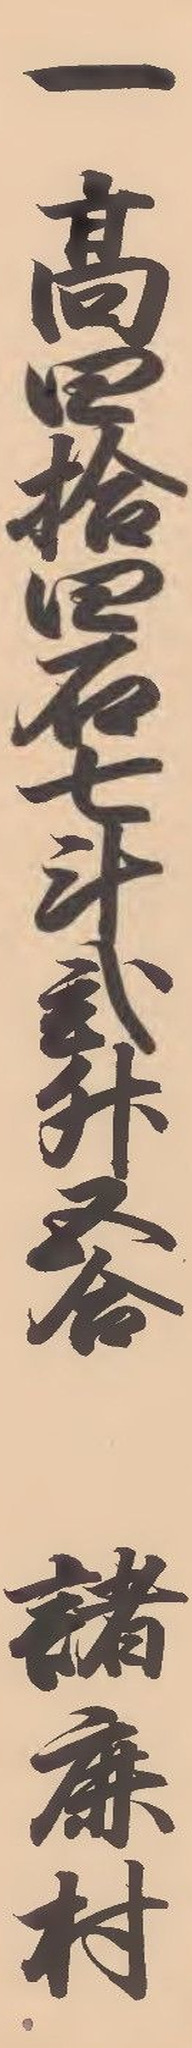一高四拾四石七斗弐升五合諸鹿村
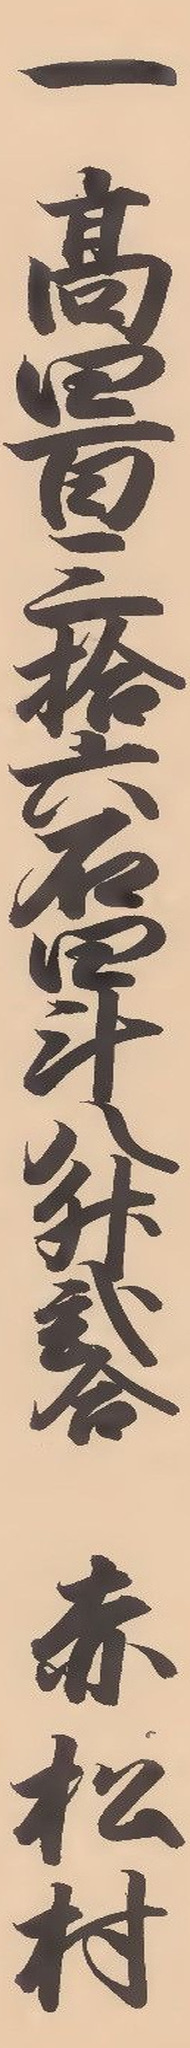一高四百三拾六石四斗八升弐合赤松村
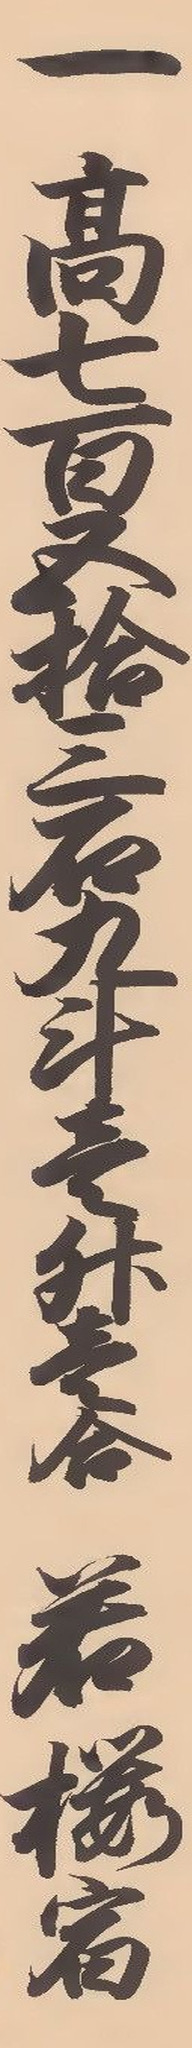一高七百五拾三石九斗壱升壱合若桜宿
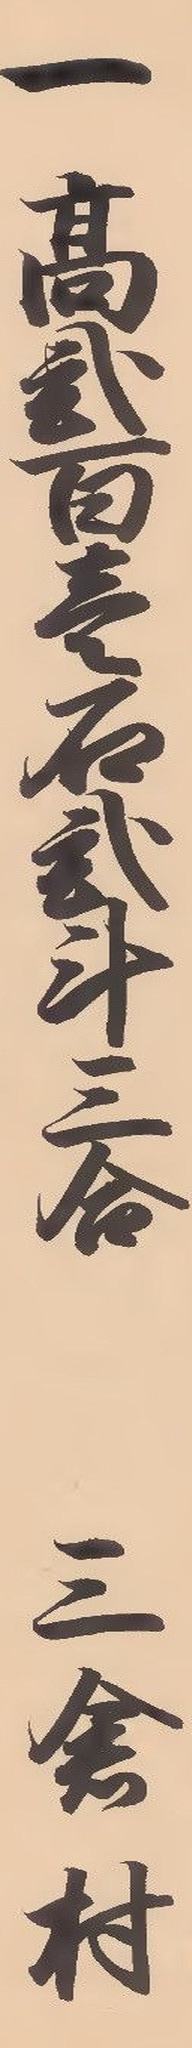一高弐百壱石弐斗三合三倉村
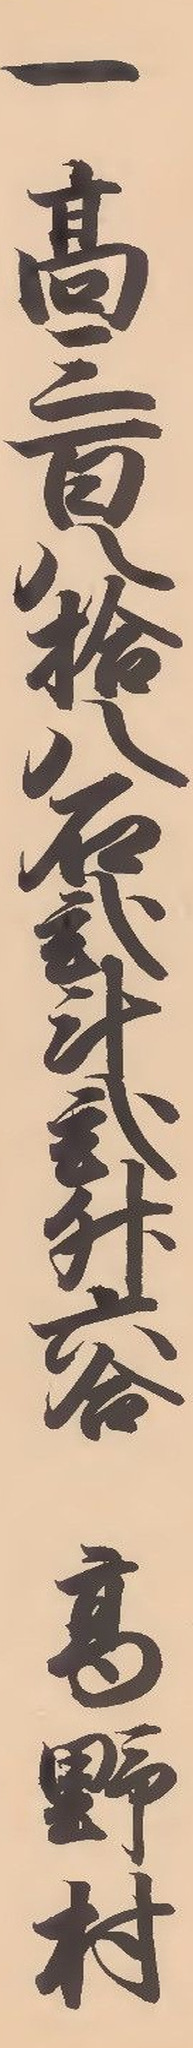一高三百八拾八石弐斗弐升六合高野村
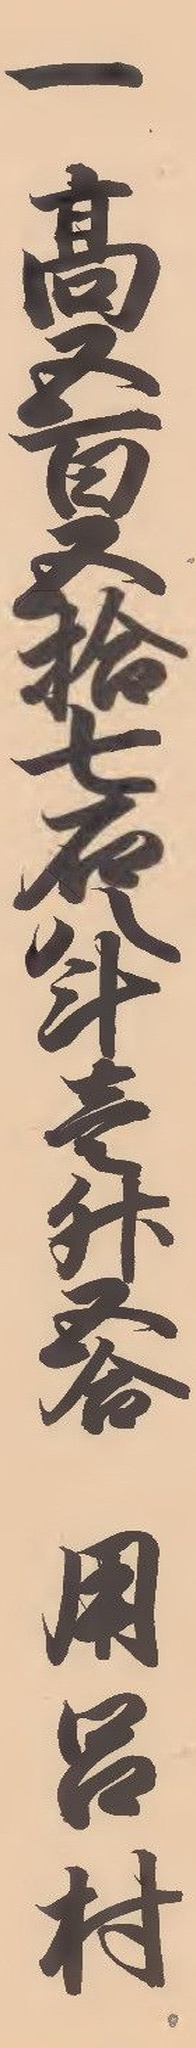一高五百五拾七石八斗壱升五合用呂村
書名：因幡国郷帳
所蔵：国立公文書館 National Archives of Japan
